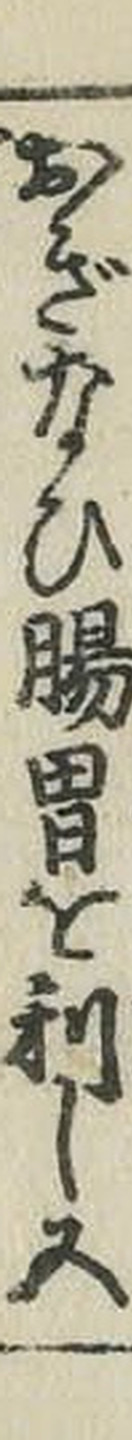おぎなひ腸胃を利し五
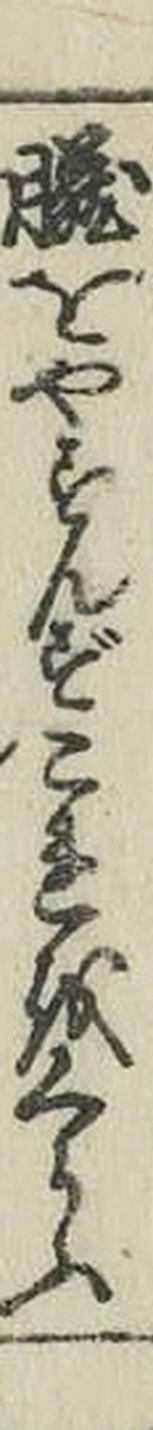臓をやすんずこれをくらふ
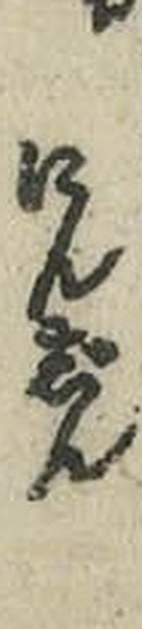にんじん
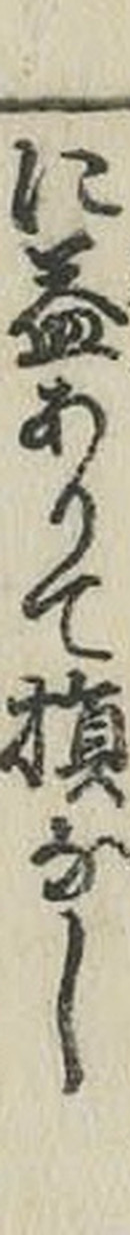に益ありて損なし

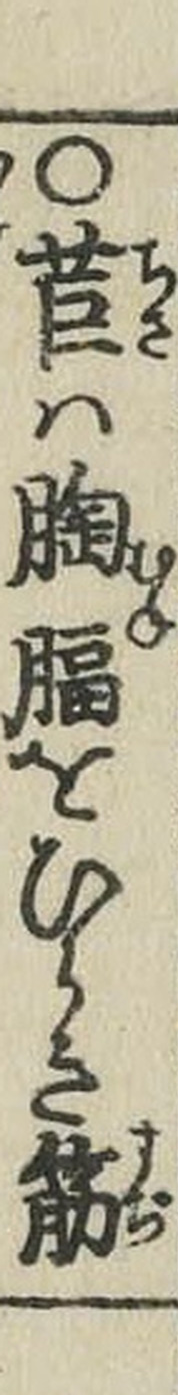○苣は胸腷をひらき筋
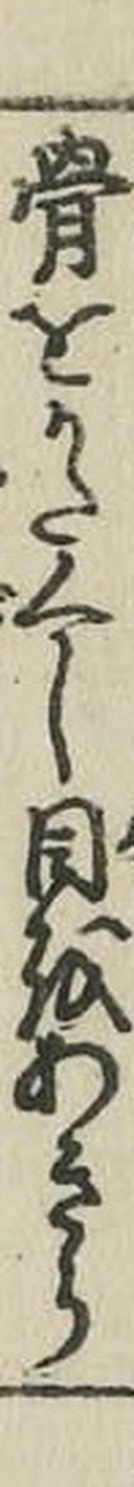骨をかたくし目をあきら
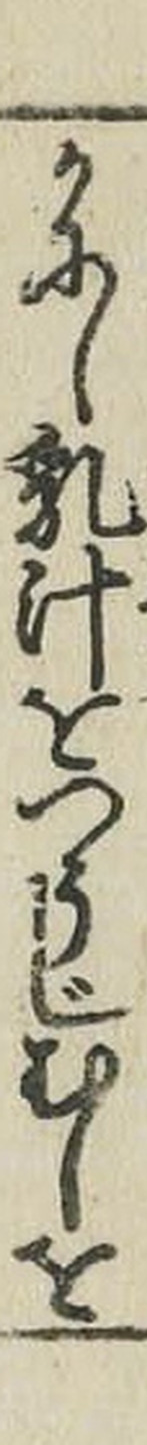かにし乳汁をつうじむしを
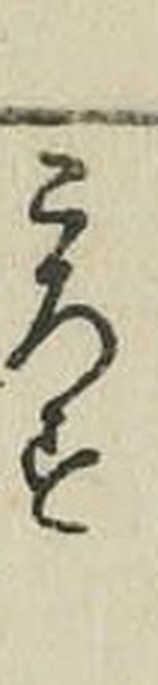ころす
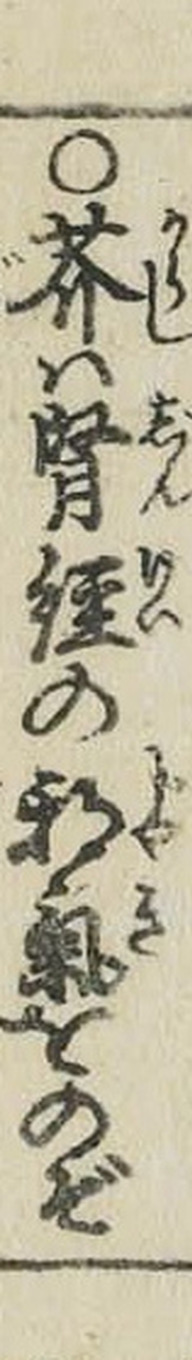○芥は腎経の邪気をのぞ
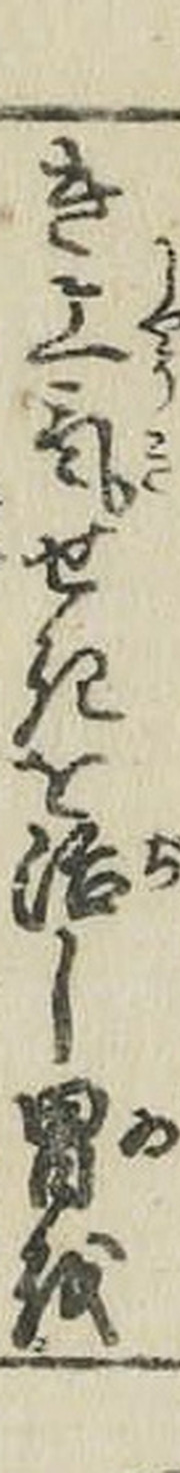き上気せきを治し胃を
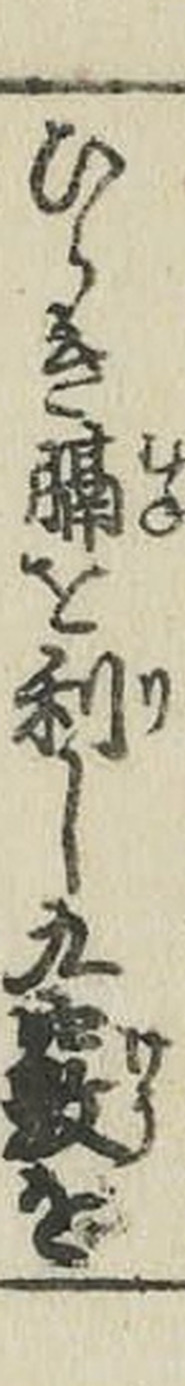ひらき胸を利し九竅を
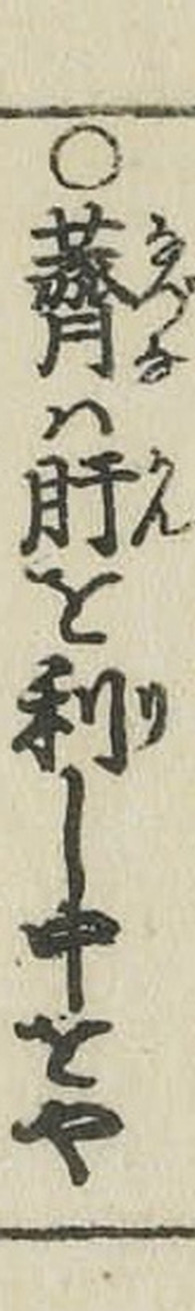○薺は肝を利し中をや
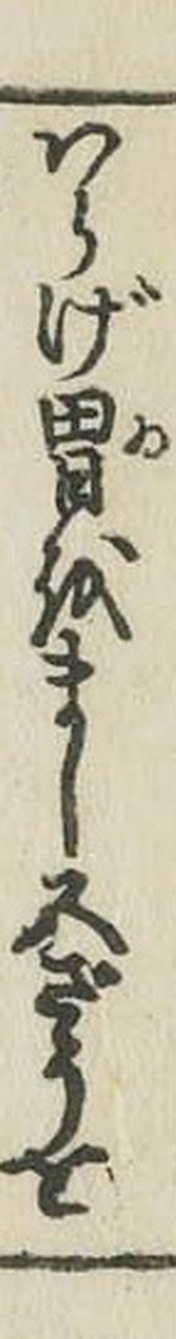はらげ胃をまし五ざうを
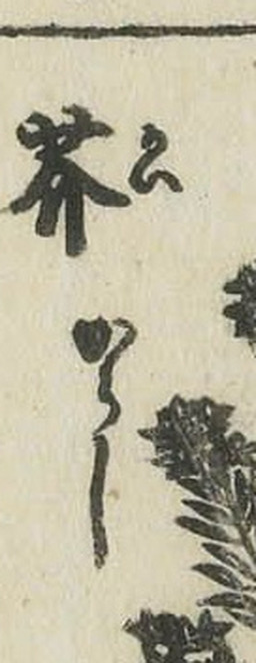芥からし
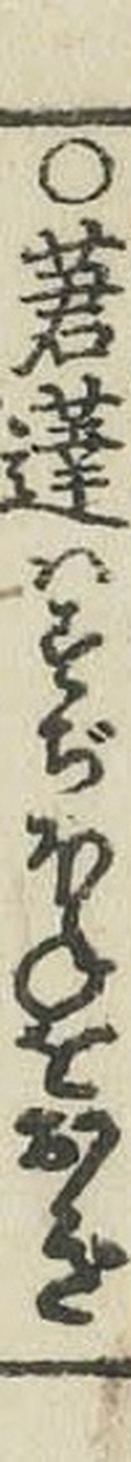○莙薘はすぢほねをおぎ
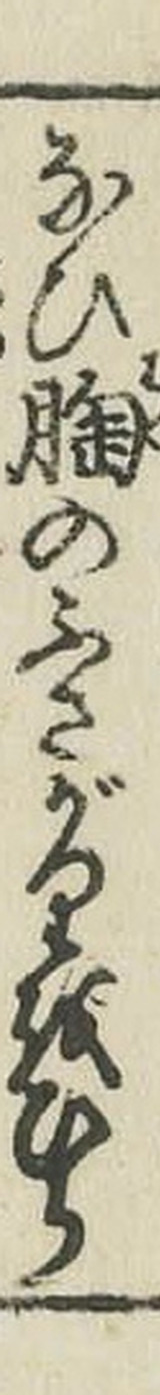なひ胸のふさがりをひら
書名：増補頭書訓蒙図彙大成 10巻 8:巻之17-19
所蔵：東京学芸大学教育コンテンツアーカイブ
